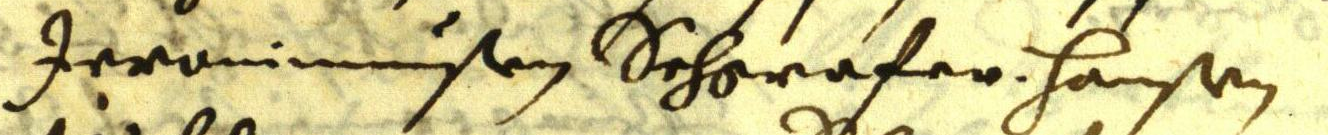Jeronimūsen Schgrafer. hansen
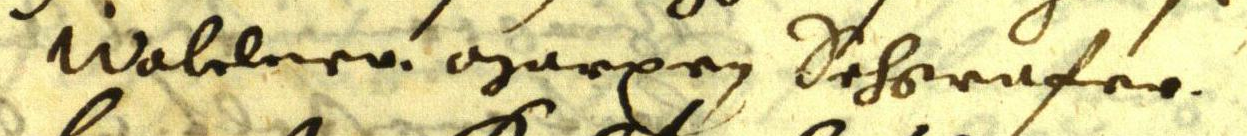Waldner. Marxen Schgrafer.
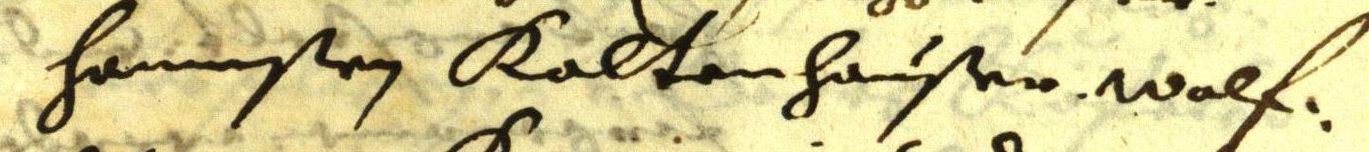hannsen Kaltenhaūser. Wolf¬
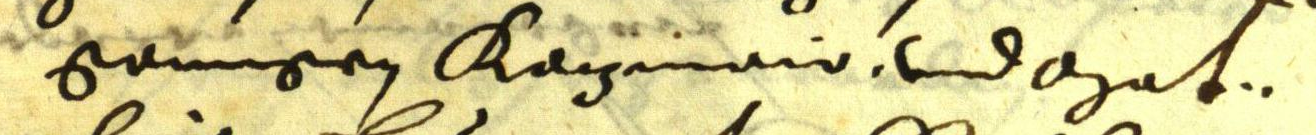ganngen Kazmair. vnd Mat¬
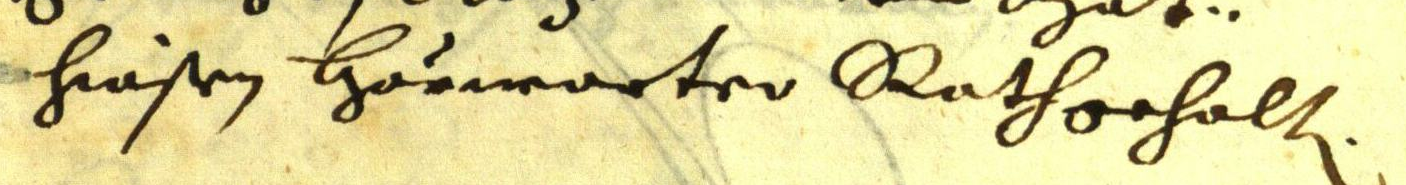hiasen Hōrwarter Rat gehalt.
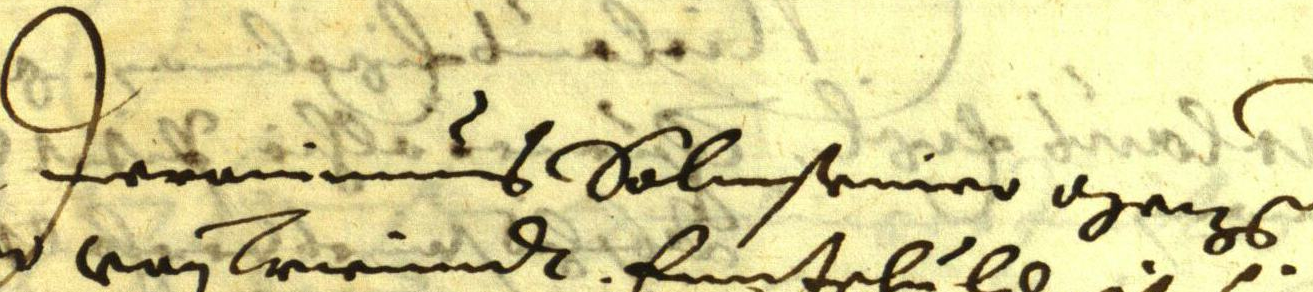Jeronimūs Salmsteiner Mezg
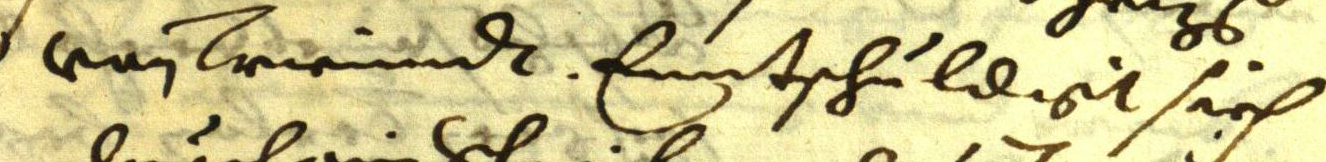von Trienndt. Entschūldigt sich
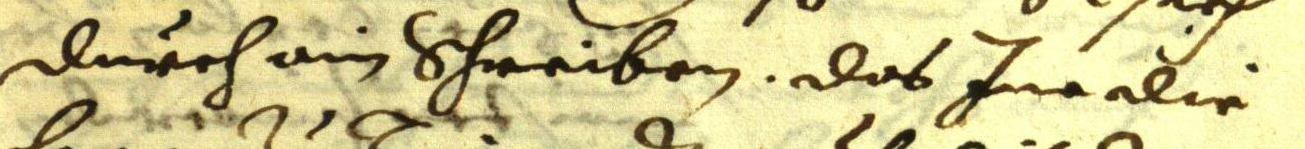dūrch ain Schreiben. das Ine die
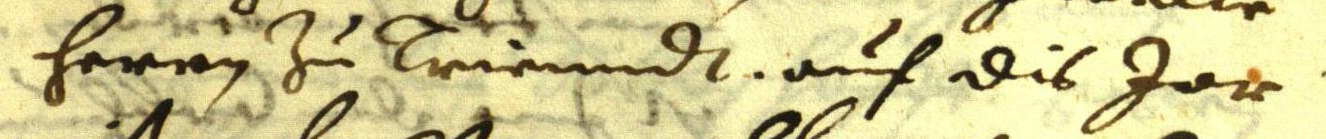herrn Zū Trienndt. aūf dis Jar
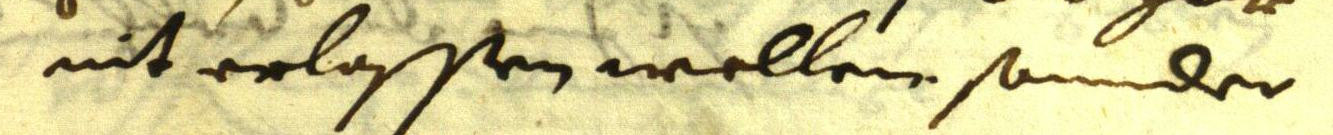nit erlassen wellen. sonnder
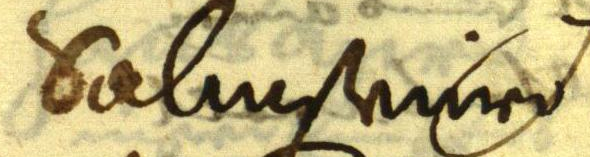Salmsteiner
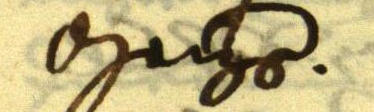Mezg.
